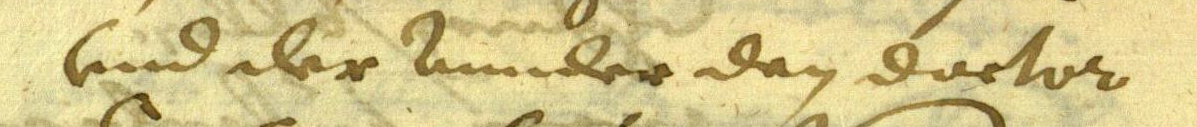vnd der Annder den doctor
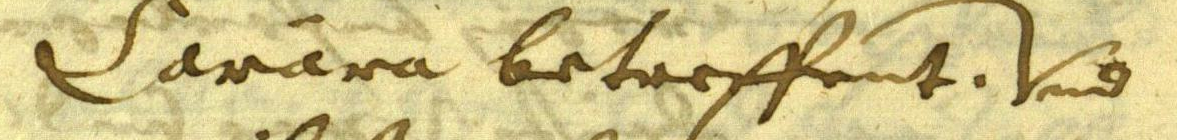Carära betreffent. Vnd
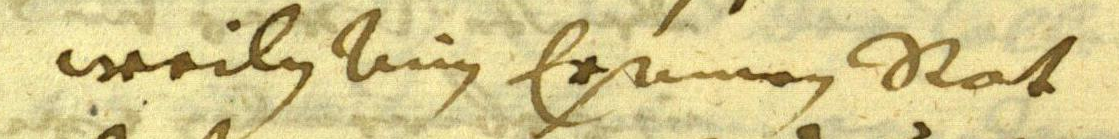weiln Aim Ersamen Rat
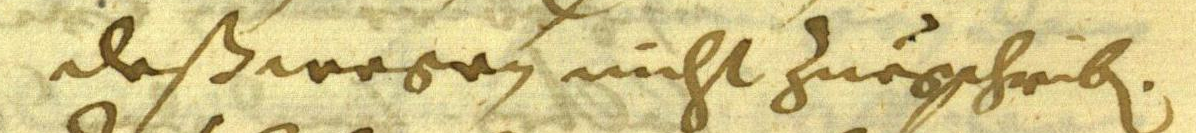deßwegen nicht Zūegschrib.
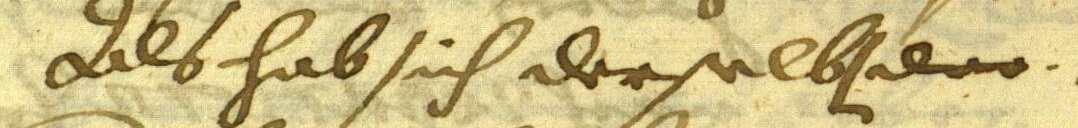Als hab sich derselb dar¬
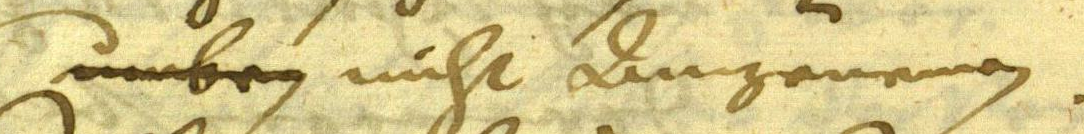ūmben nicht Anzenemen.
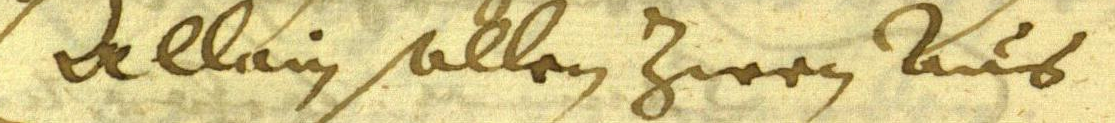Allain sollen Zween Aūs
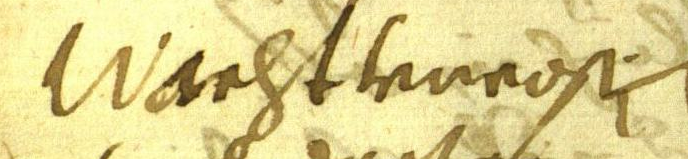Wacht vncost
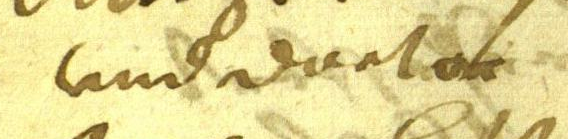vnd doctor
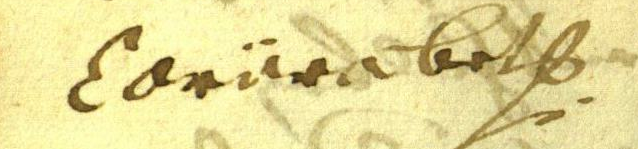Carära bet.
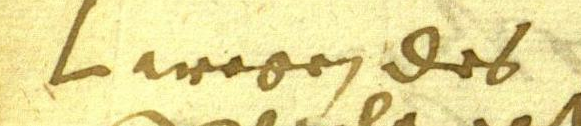wegen des
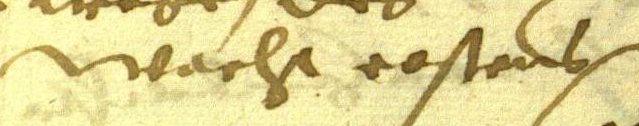Wacht costens
